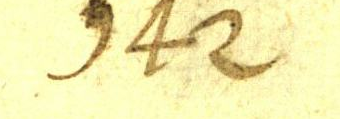142
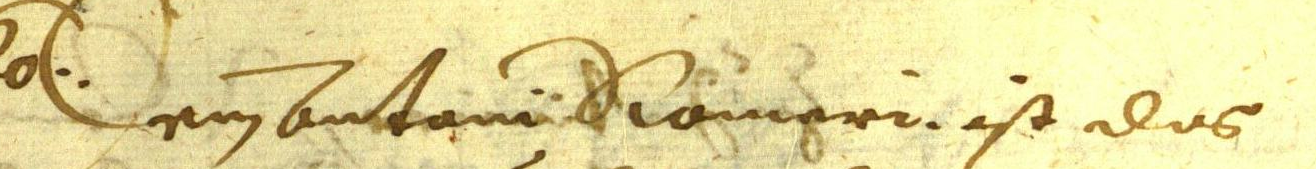Dem Antoni Romeri. ist das
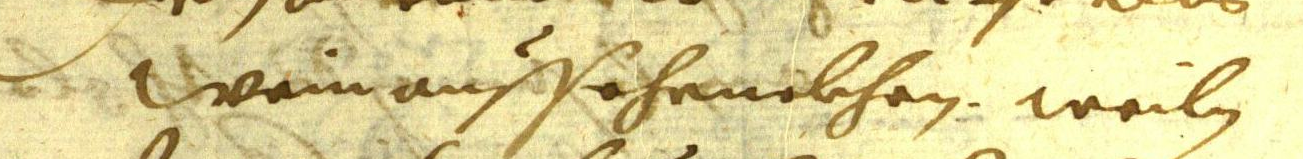Wein aūsschenckhen. weiln
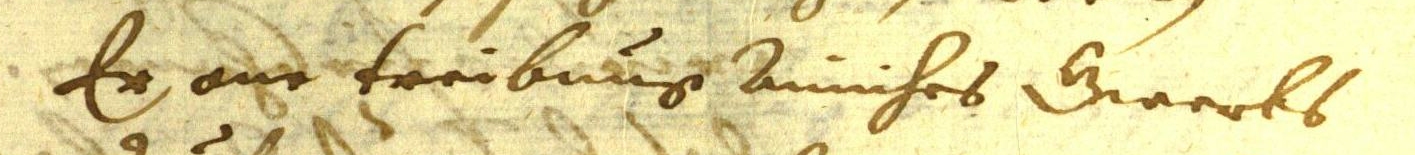Er one treibūng Ainiches Gwerbs
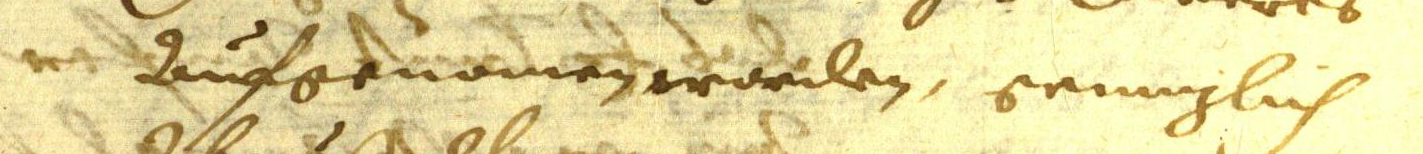Aūfgenomen worden, gennzlich
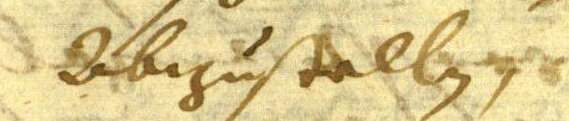Abzūstelln,
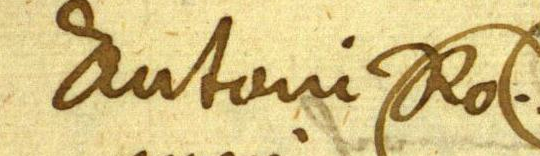Antoni Ro¬
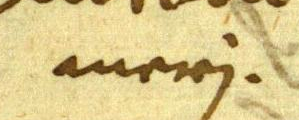merj.
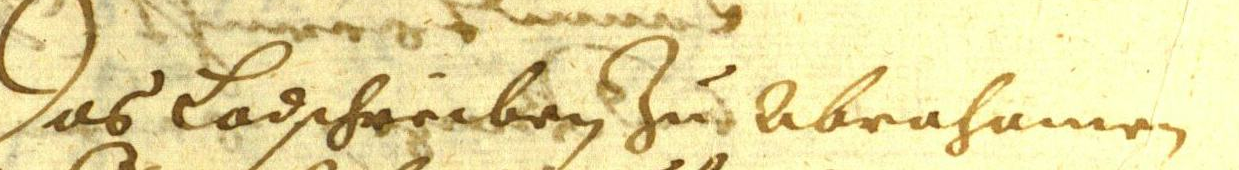Das Ladschreiben Zū Abrahamen
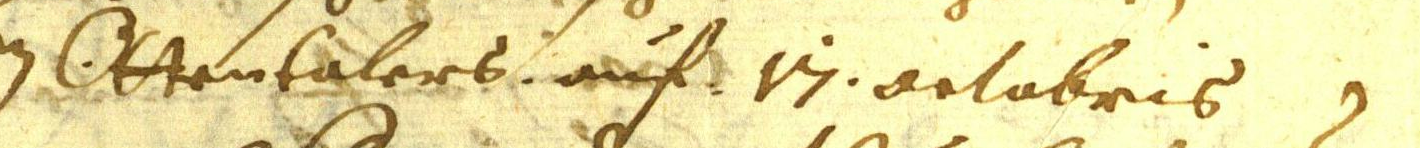Ottentalers. aūf: 17. octobris
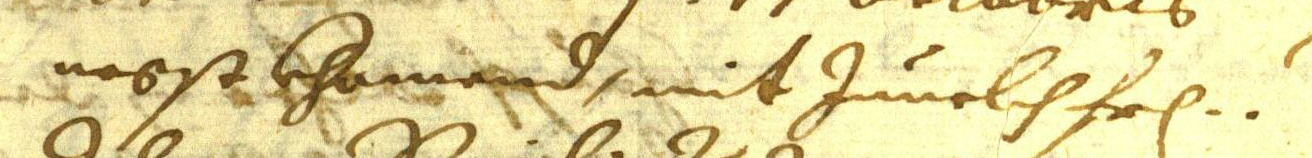negst khomend, mit Jūnckhfr:
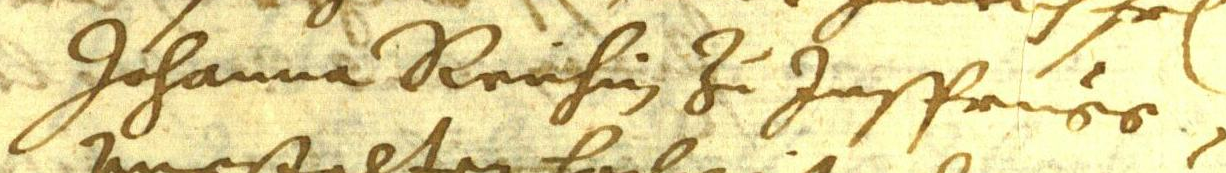Johanna Reichin Zū Insprūgg
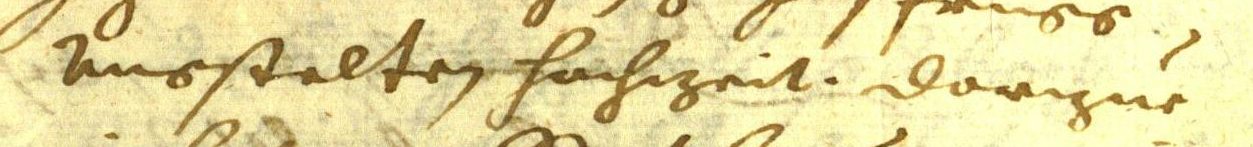Angestelten hochzeit. darzūe
